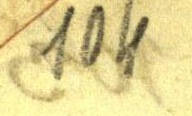104
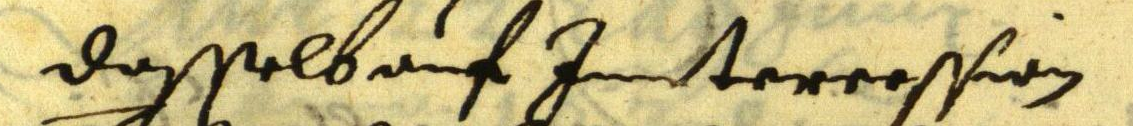dasselb aūf Inntercession
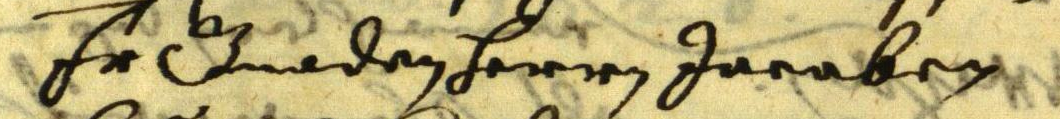Ir Gnaden herrn Jacoben
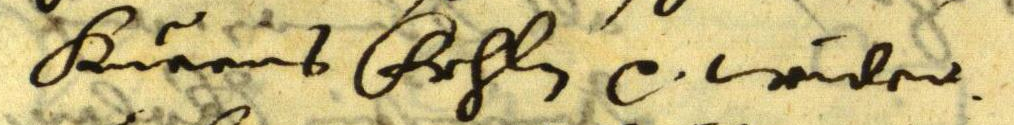Kūeens Frhn etc. wider¬
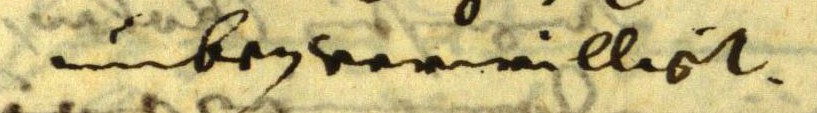ūmben verwilligt.
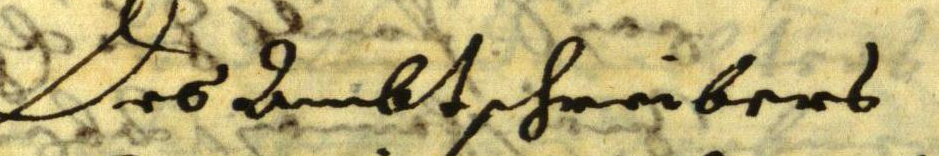Des Ambtschreibers
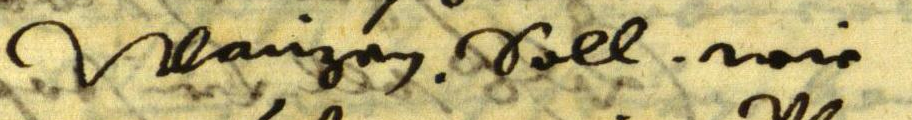Waizen. Soll. wie
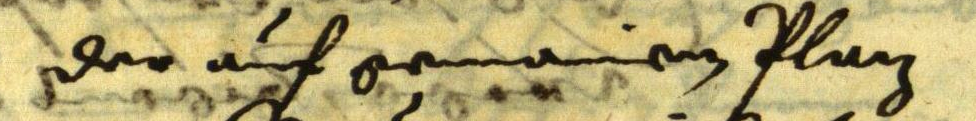der aūf gemainen Plaz
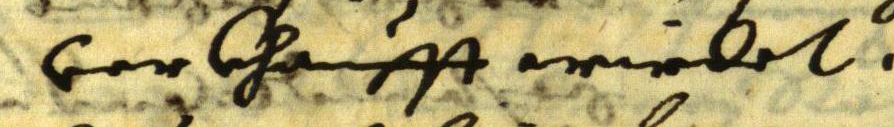verkhaūfft wirdet.
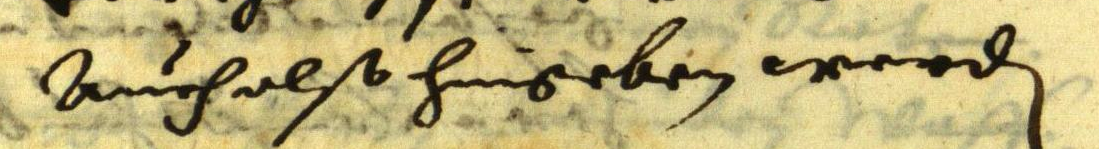Aūch also hingeben werd
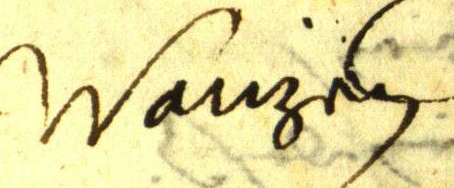Waizen
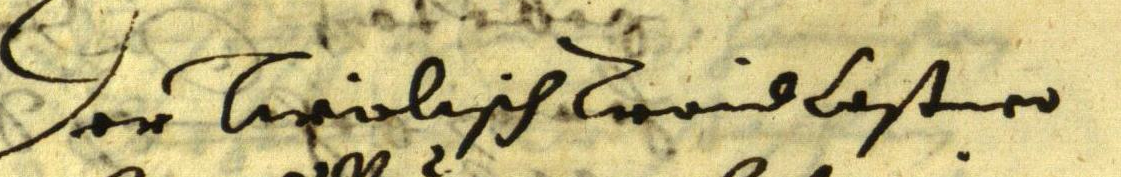Der Tirolisch Traid Castner
